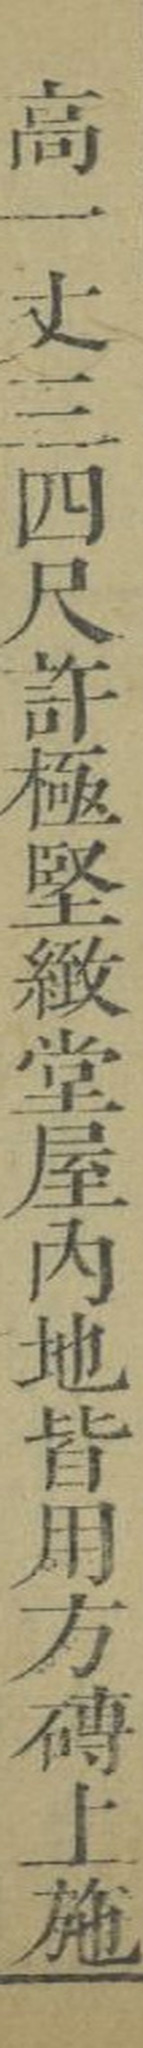高一丈三四尺許極堅緻堂屋内地皆用方磚上施
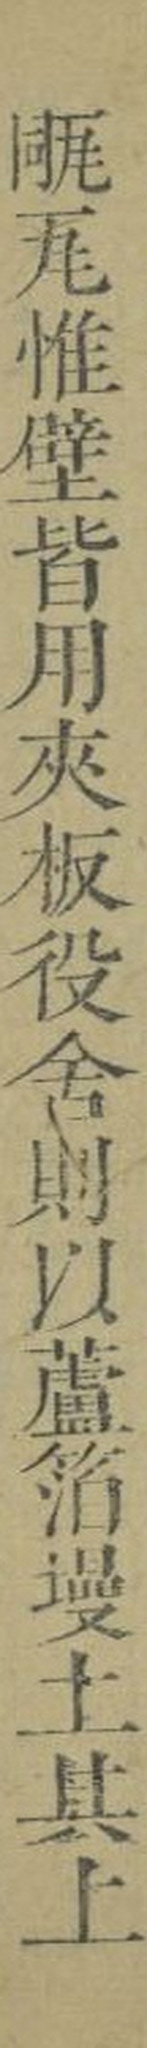瓦惟壁皆用夾板役舎則以蘆箔墁土其上
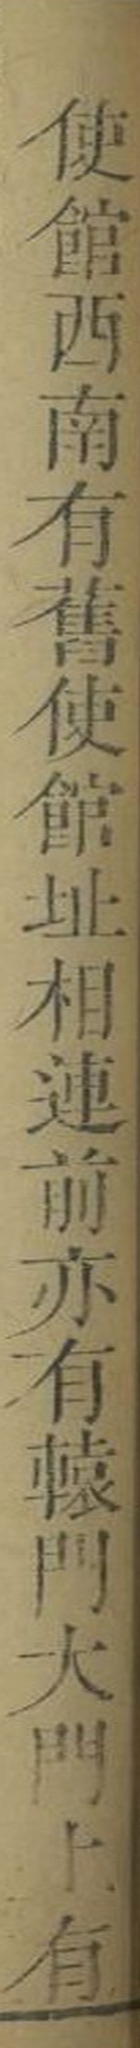使館西南有舊使館址相連前亦有轅門大門上有
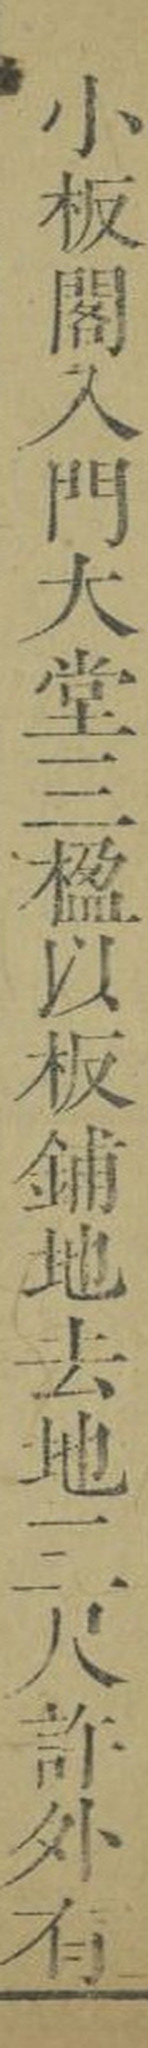小板閣入門大堂三楹以板鋪地去地三尺許外有
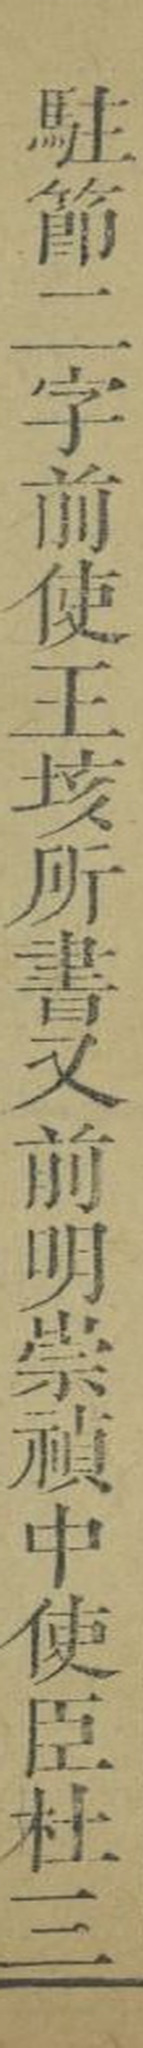駐節二字前使王垓所書又前明崇禎中使臣杜三
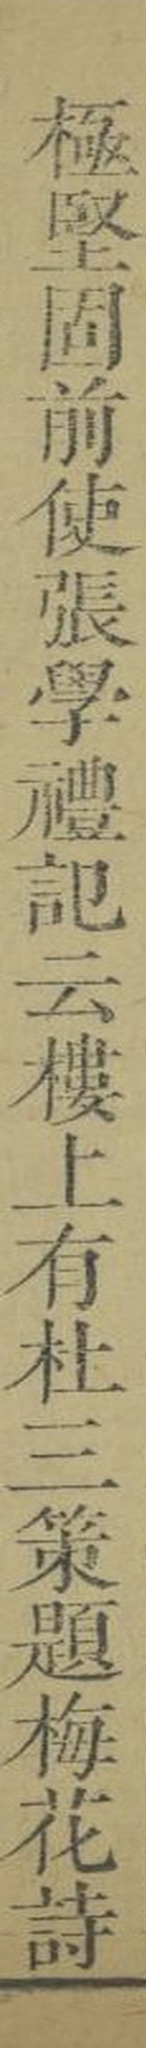極堅固前使張學禮記云樓上有杜三策題梅花詩
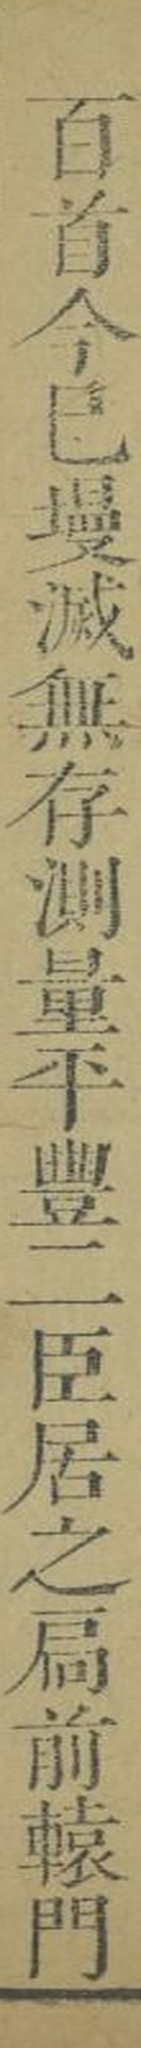百首今巳墁滅無存測量平豐二臣居之扃前轅門
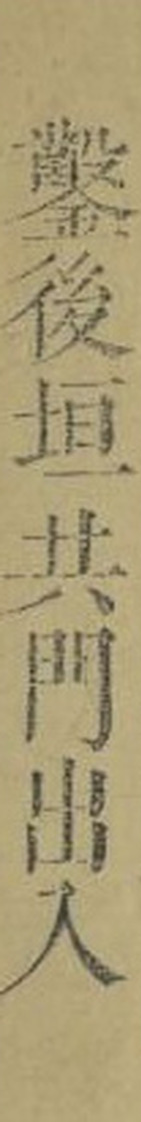鑿後垣共門出入
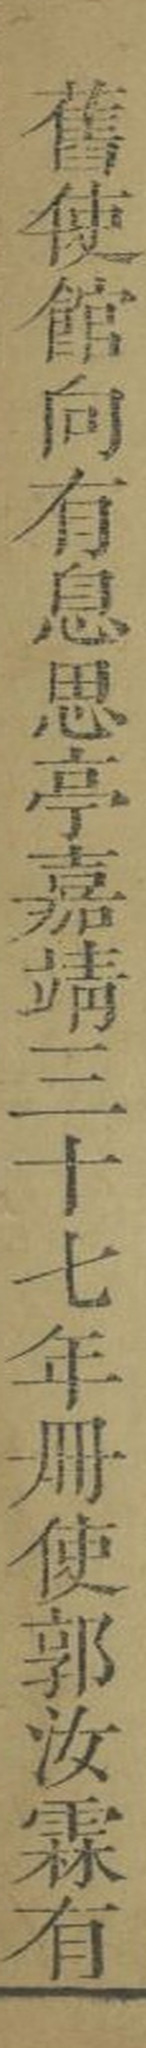舊使館向有息思亭嘉靖三十七年冊使郭汝霖有

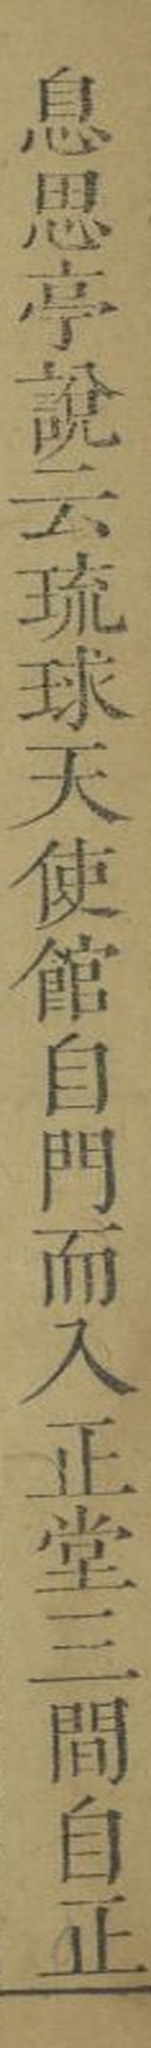息思亭說云琉球天使館自門而入正堂三間自正
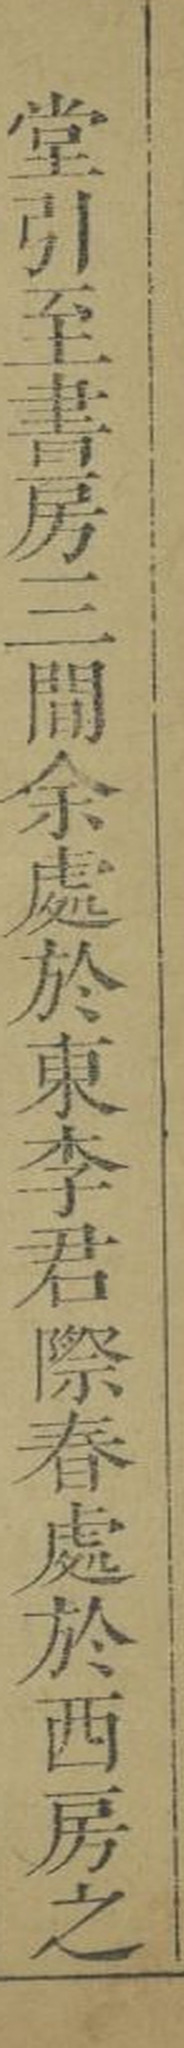堂引至書房三間余處於東李君際春處於西房之
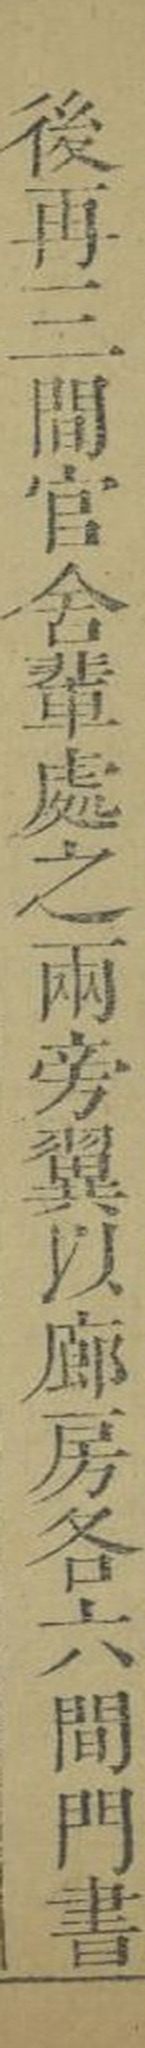後再三間官舎輩處之兩旁翼以廊房各六間門書
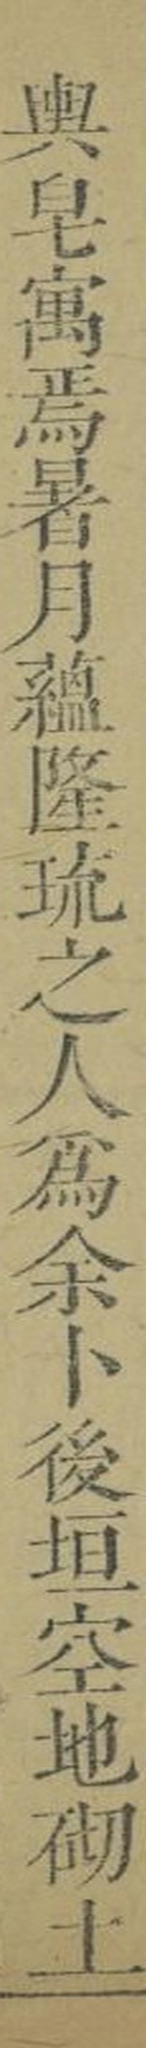輿皂寓焉暑月蘊隆琉之人爲余卜後垣空地砌土
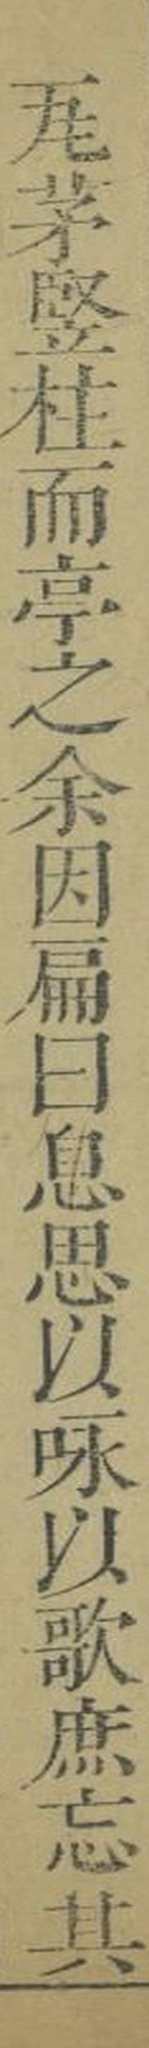瓦茅竪柱而亭之余因扁曰息思以咏以歌庶忘其
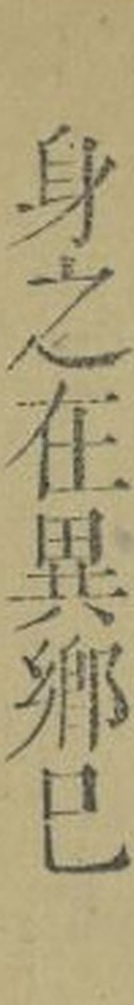身之在異鄕巳
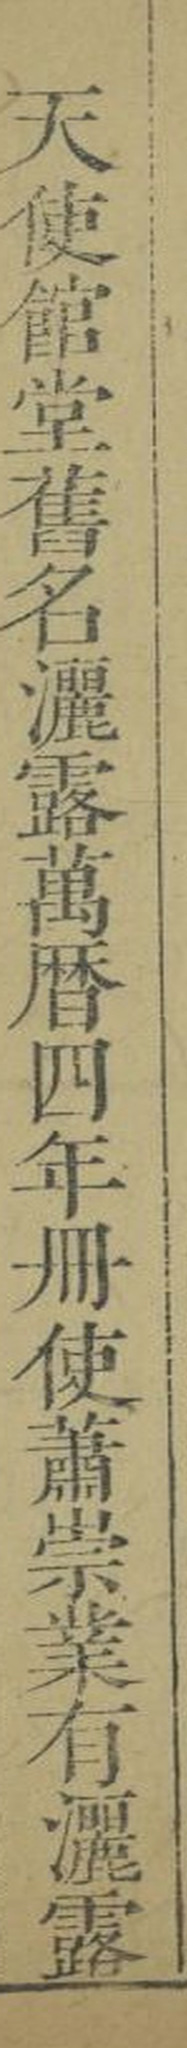天使館堂舊名灑露萬暦四年冊使蕭崇業有灑露
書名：中山伝信録 巻二
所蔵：University of the Ryukyus Library
